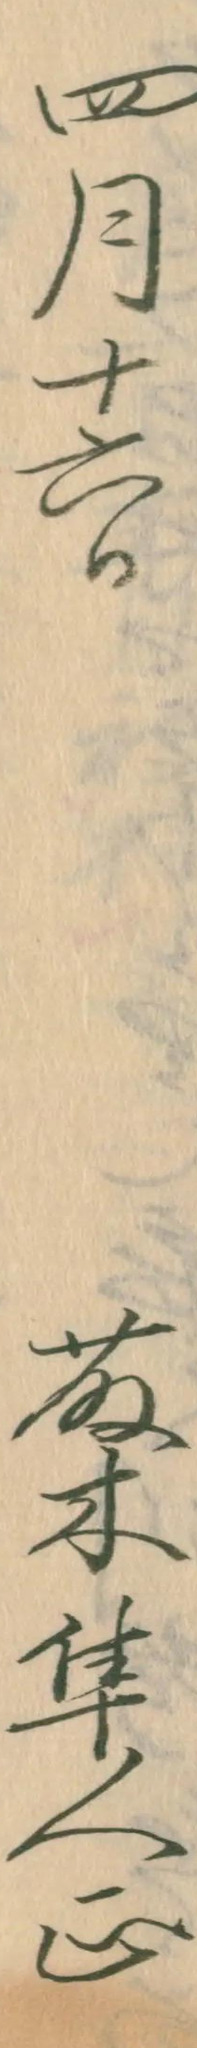四月十六日藤木隼人正
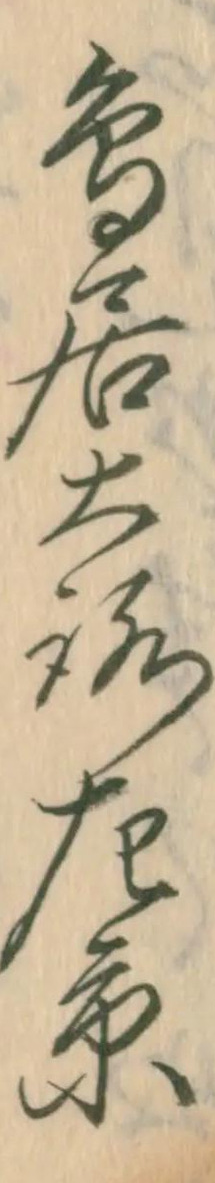鳥居大路左京
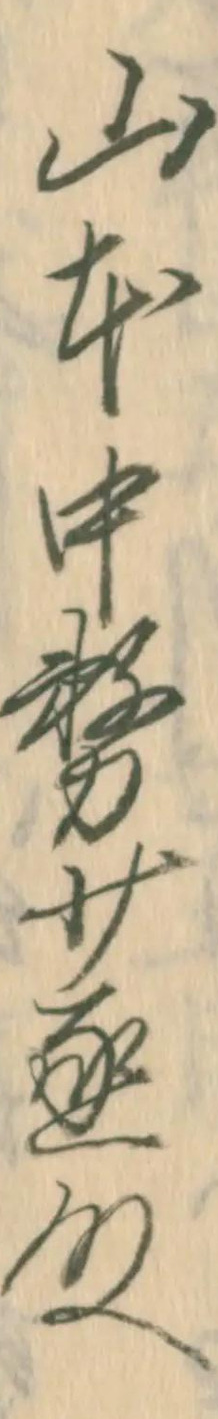山本中務少丞殿
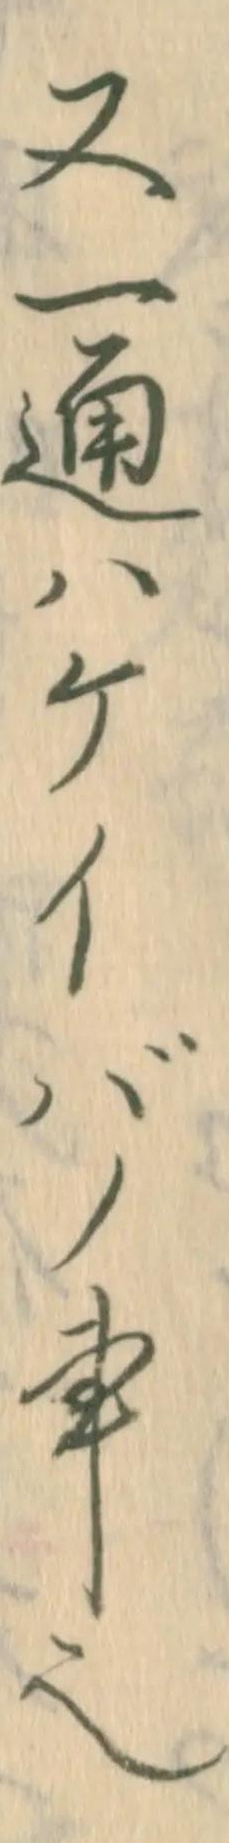又一通ハケイバノ事也
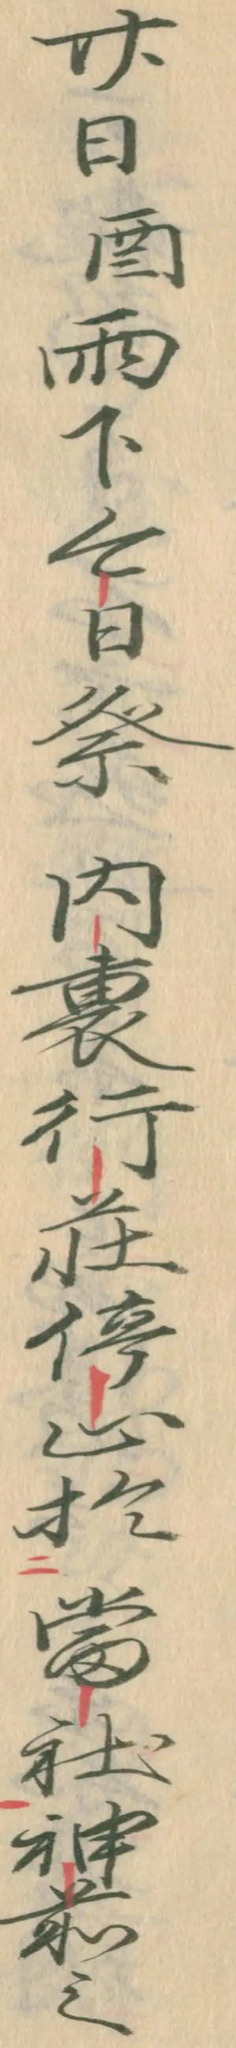廿日酉雨下今-日祭内-裏行-荘停-止於当-社神-前之
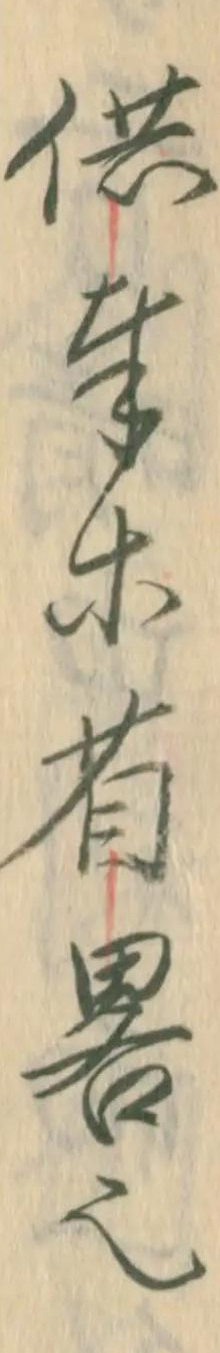供-奉等省-略也

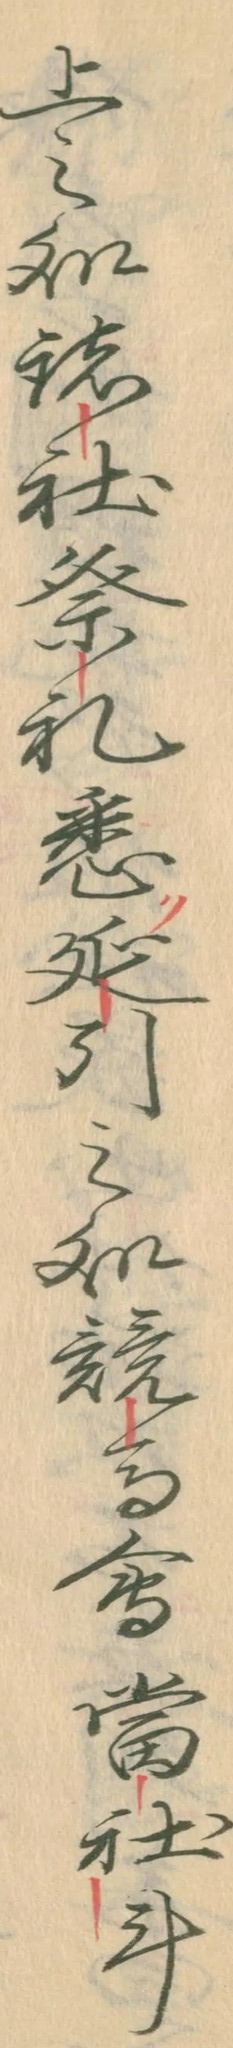上之処諸-社祭-礼悉延-引之処競-馬会当-社_計
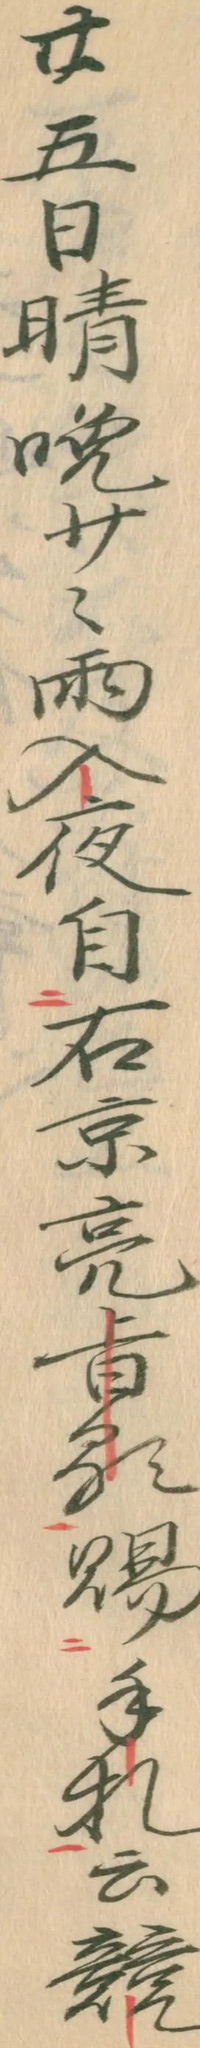廿五日晴晩少々雨入-夜自右京亮旨顕賜手-札云競-
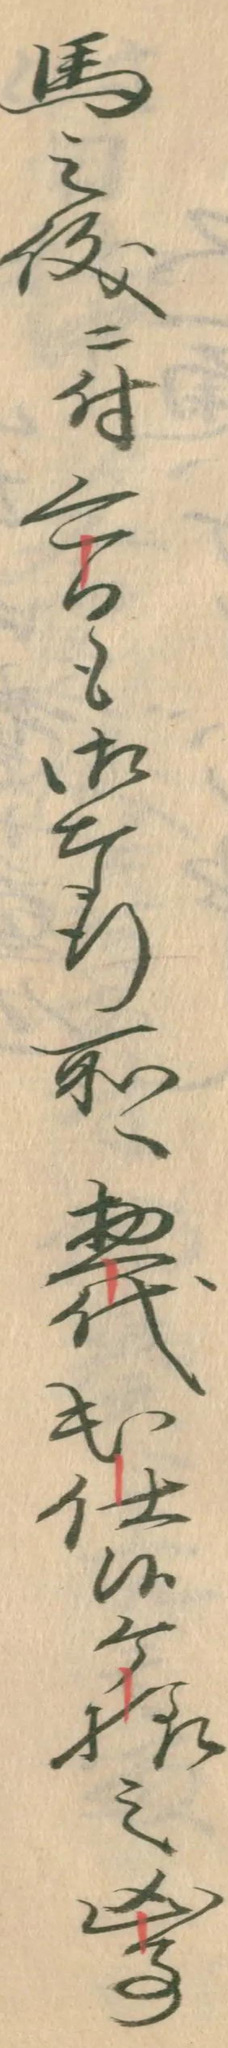馬之儀ニ付今-日も御奉行所へ惣-代出-仕候ケ-様之凶-事
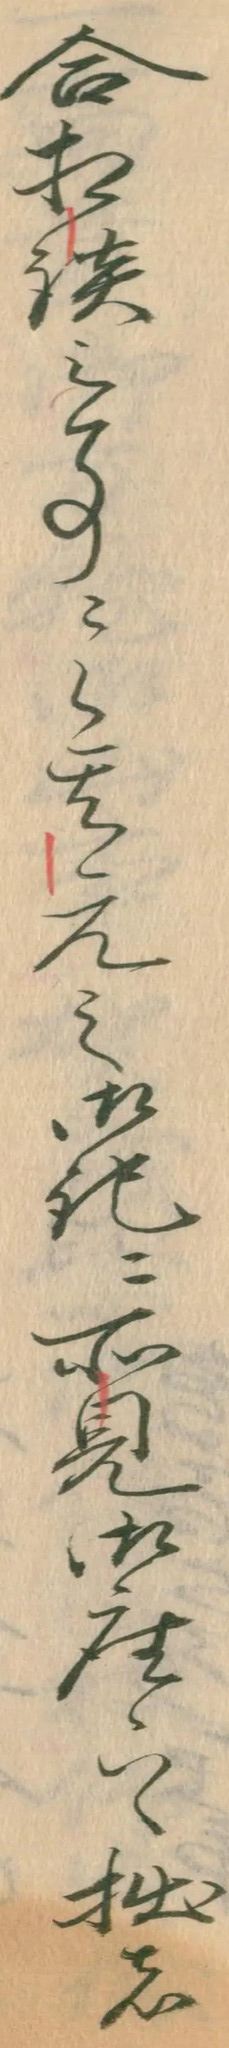合相-談之事ニ候其_元之御記ニ所-見御座候ハヽ拙者
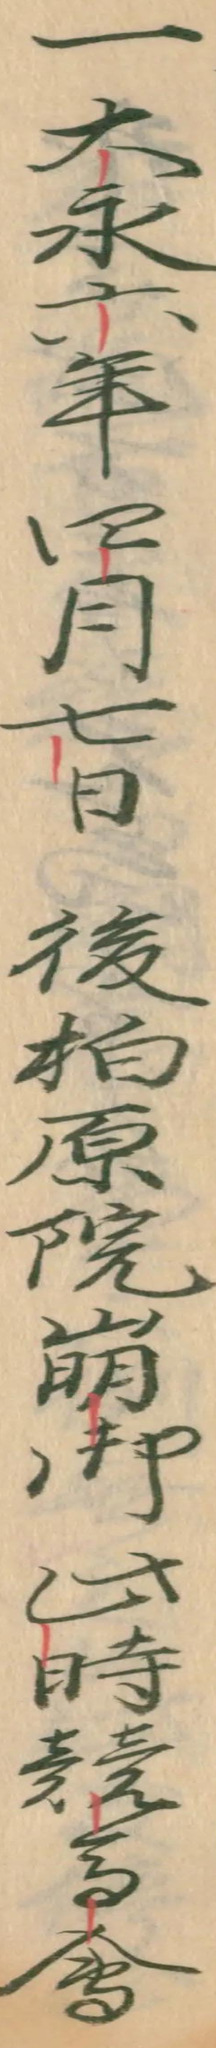一大-永六-年四-月七_日後柏原院崩-御此_時競-馬-会
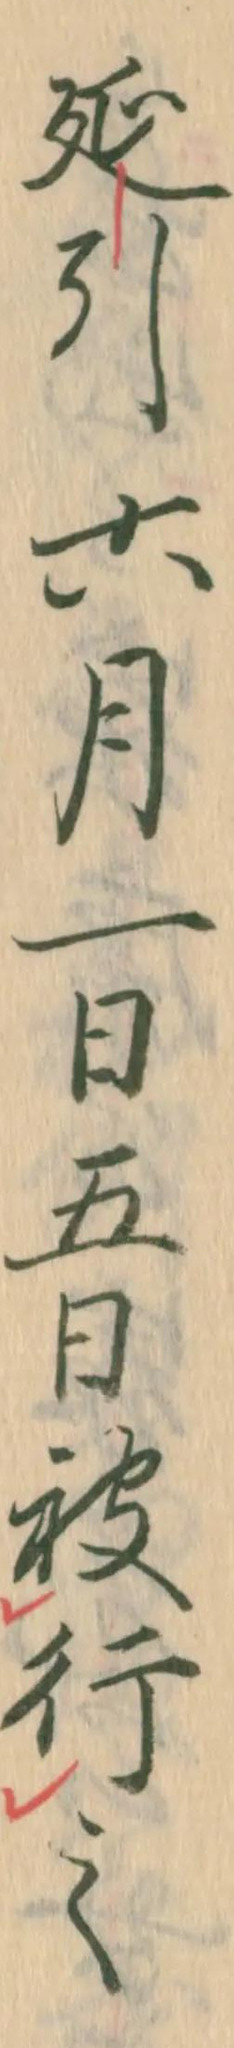延-引六月一日五日被行之
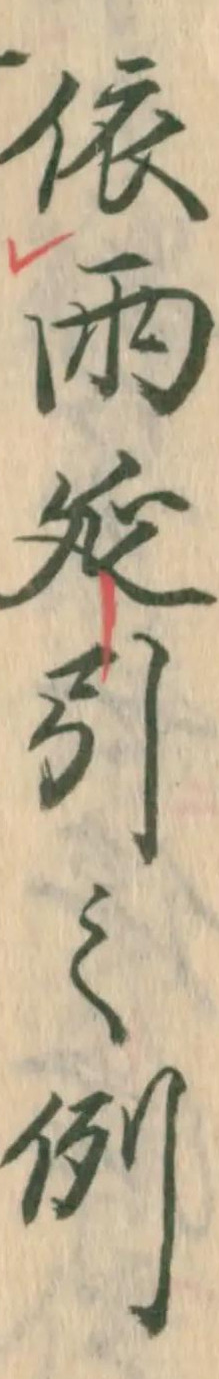依雨延-引之例
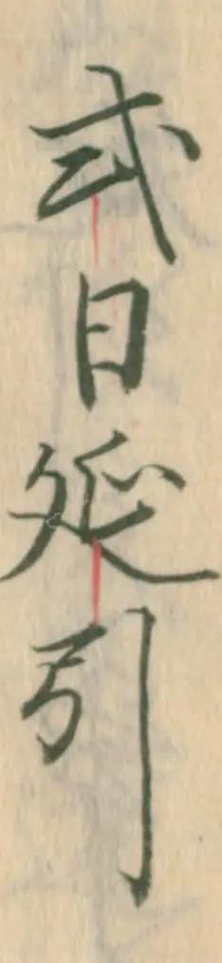式日延-引
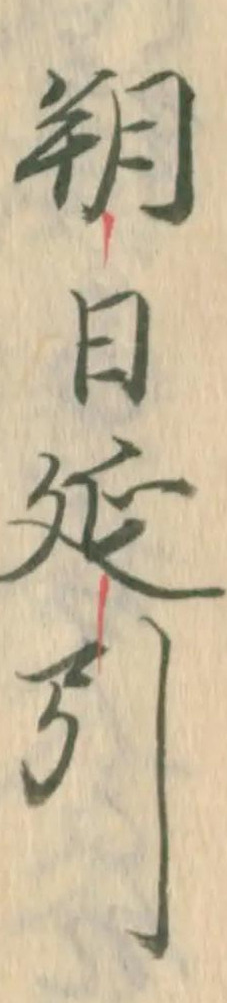朔-日延-引
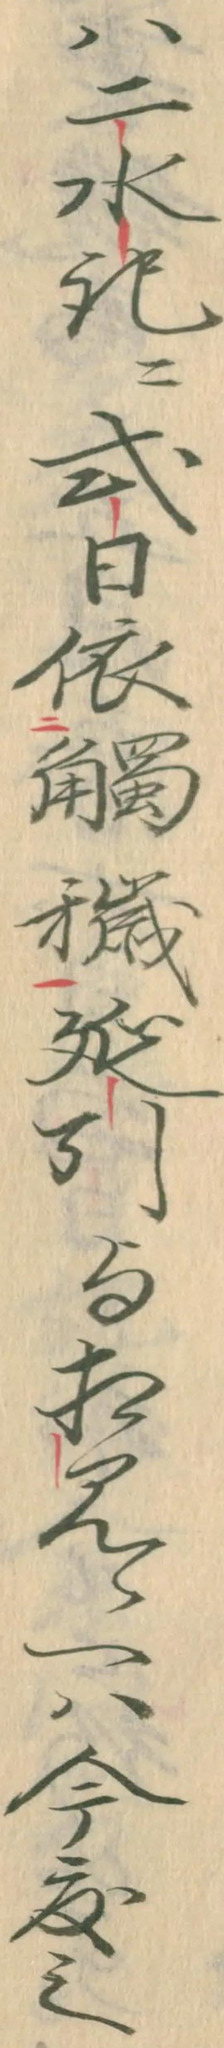ハ二-水-記ニ式-日依触穢延-引与相_見候ヘハ今度之
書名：賀茂社記録. 第16冊
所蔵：国立国会図書館 National Diet Library, JAPAN
